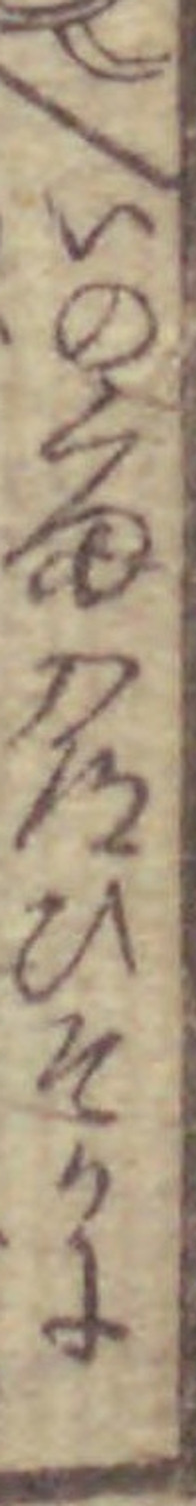いのくま入道ひそかに
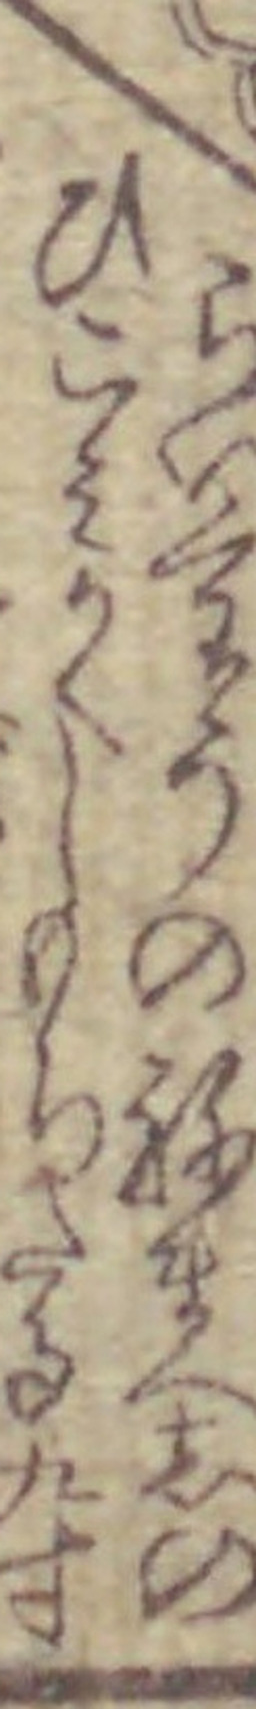ひこみかくしもちたる九寸
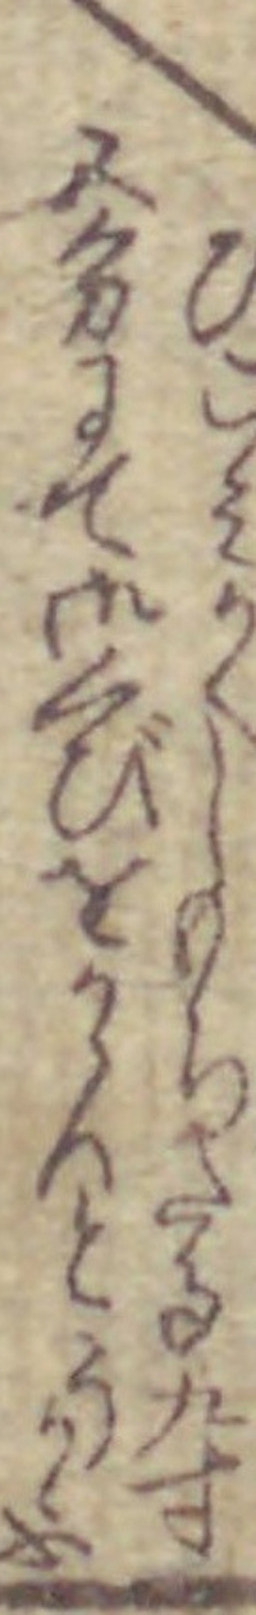五分にて御くびをかゝんとうかゝふ
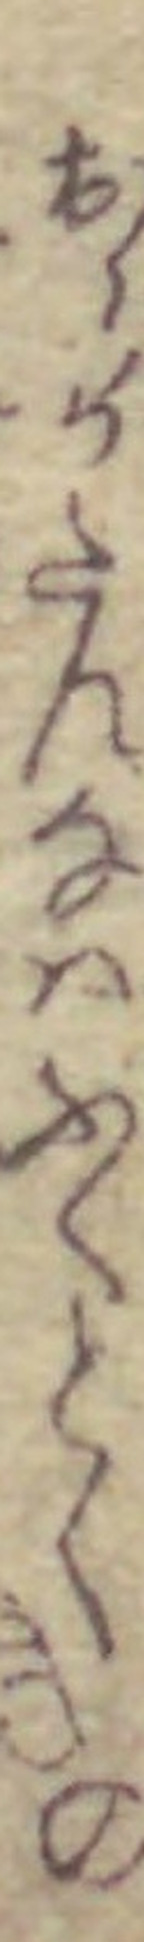おらかたんなはふくとくの
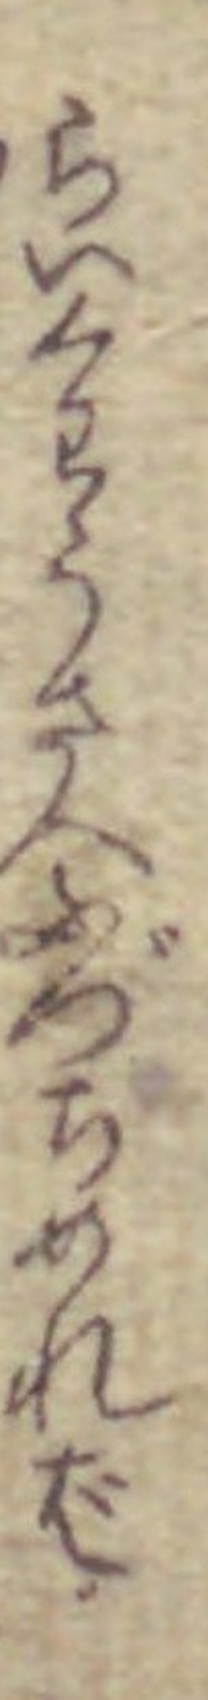らいくわうさへぶつちめれば
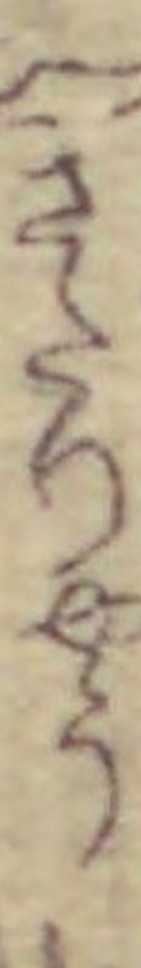きたりやう
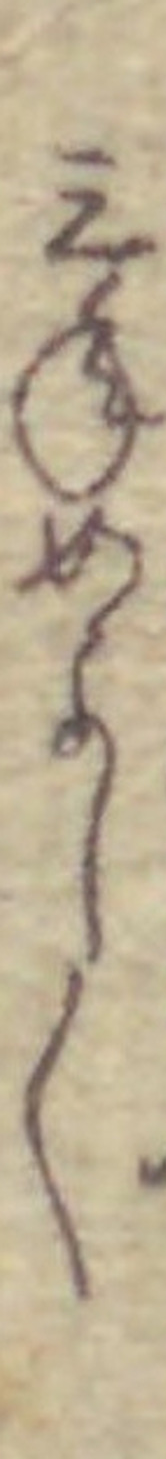三年めよし〳〵
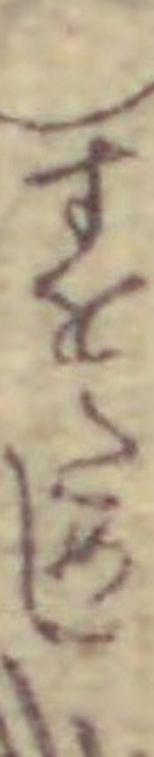すをためし
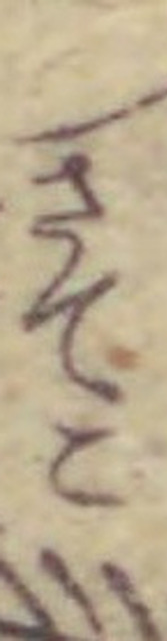さてこ

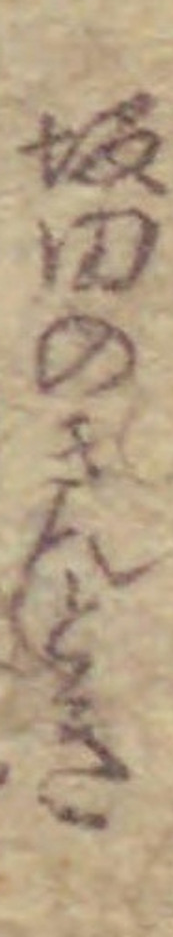坂田のきんとき
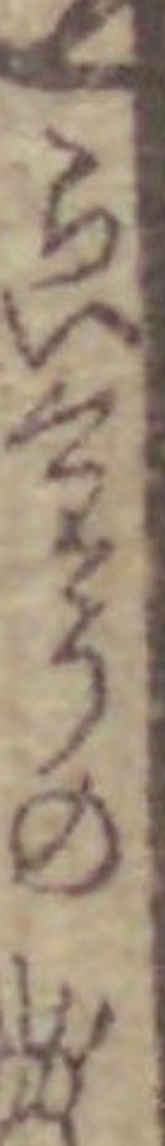らいくわうの
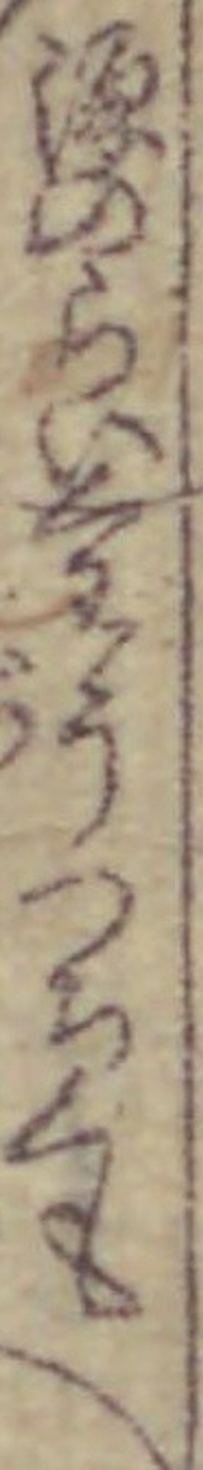源のらいくわうつちくも
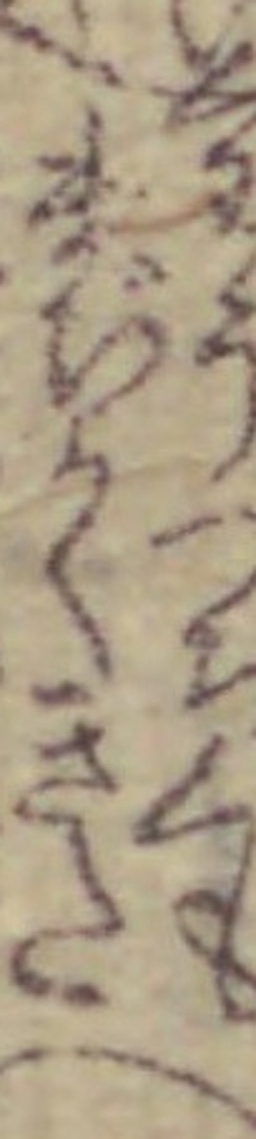まぢかくきた
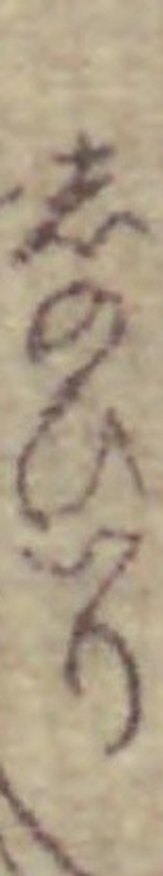しのひいり
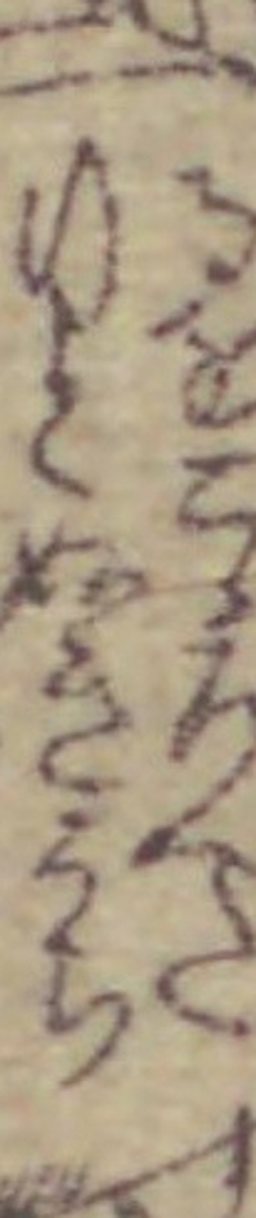りとぬきうち
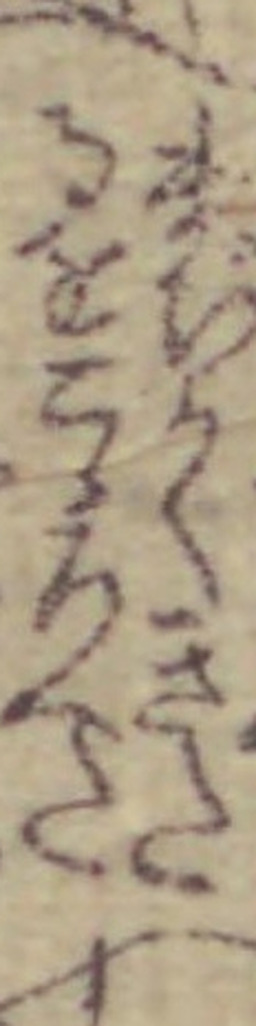るをこゝろへた
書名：とんだ茶釜 2巻
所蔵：国立国会図書館 National Diet Library, JAPAN
